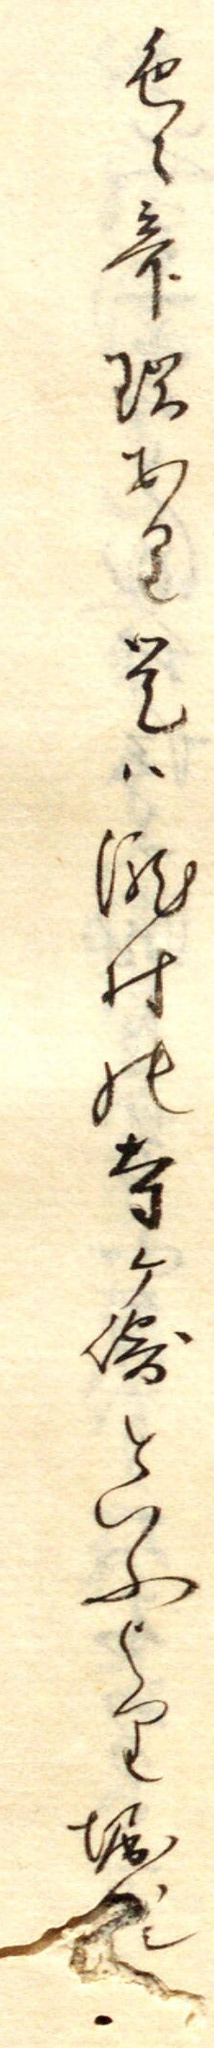色々奇瑞あり是は瀧村の寺ヶ崎といふより掘出し

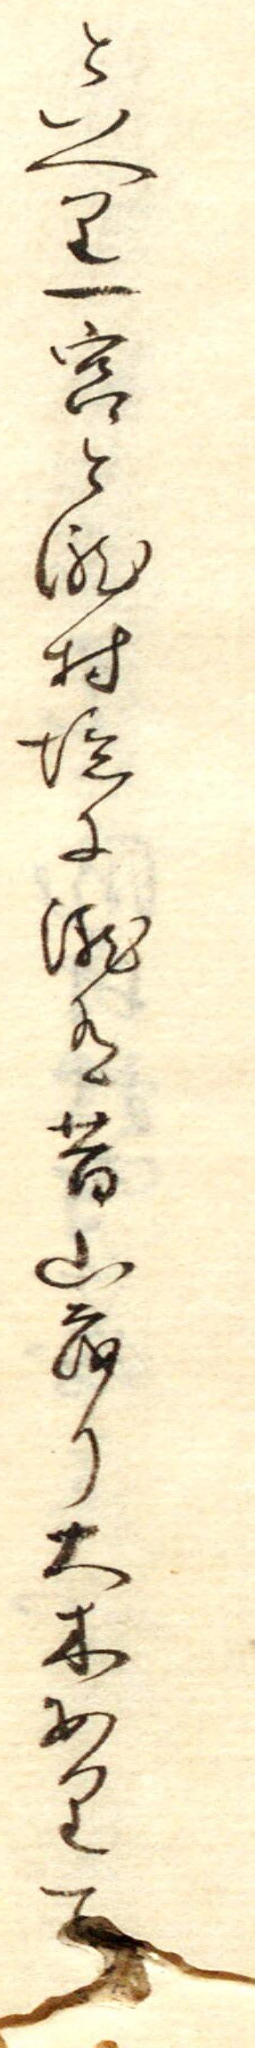といへり一宮と瀧村境に瀧有昔山茂り大木ありて
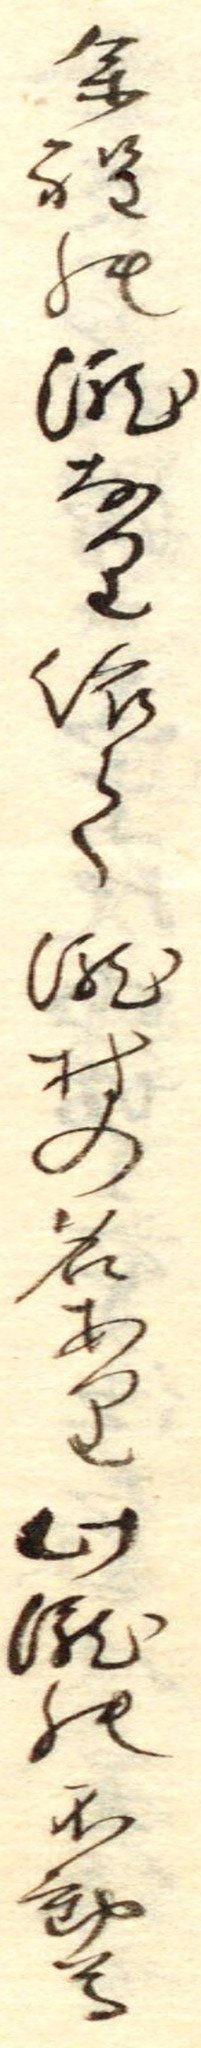余程の瀧なり依て瀧村の名あり此瀧の不動尊
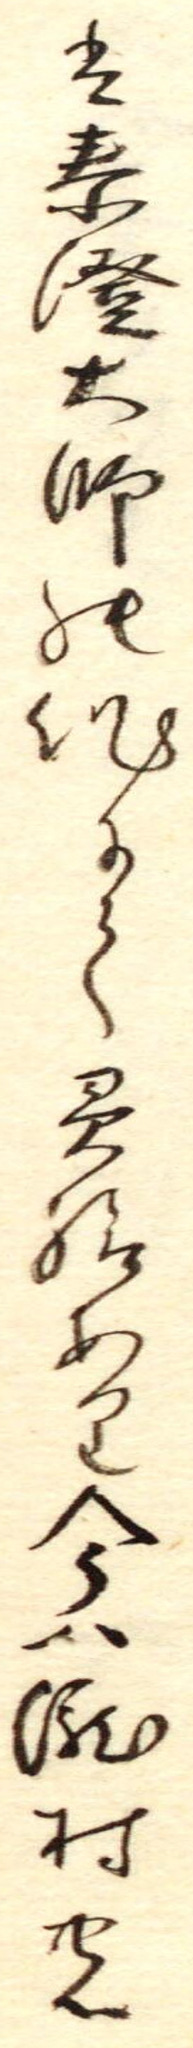は泰澄大師の作にて霊給あり今は瀧村の
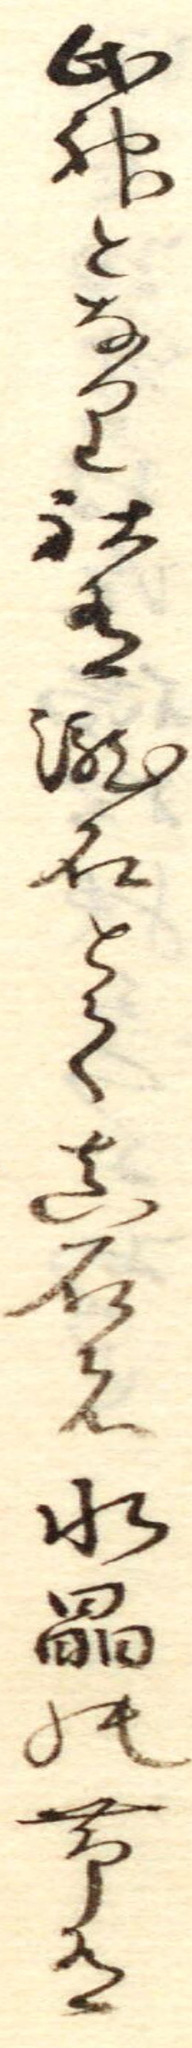氏神となり社有瀧名とて真石の水晶の帯有
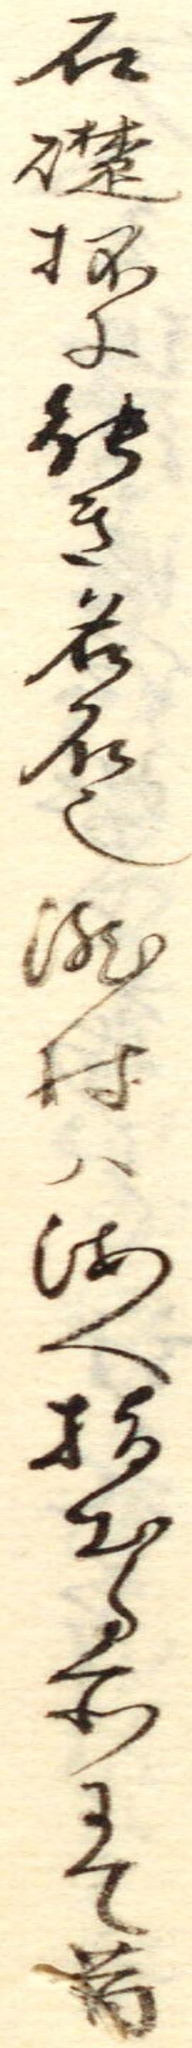石礎抔に能き名石也瀧村は海へ指出る所にて昔
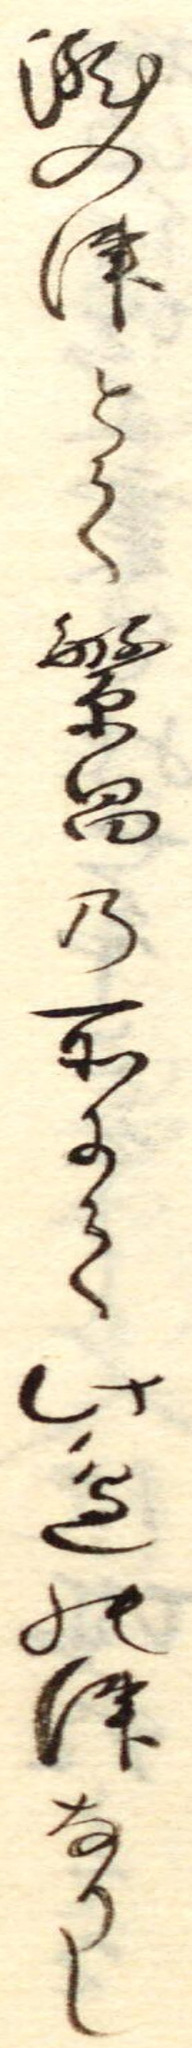瀧の津とて繁昌の所にて此辺の津なりし
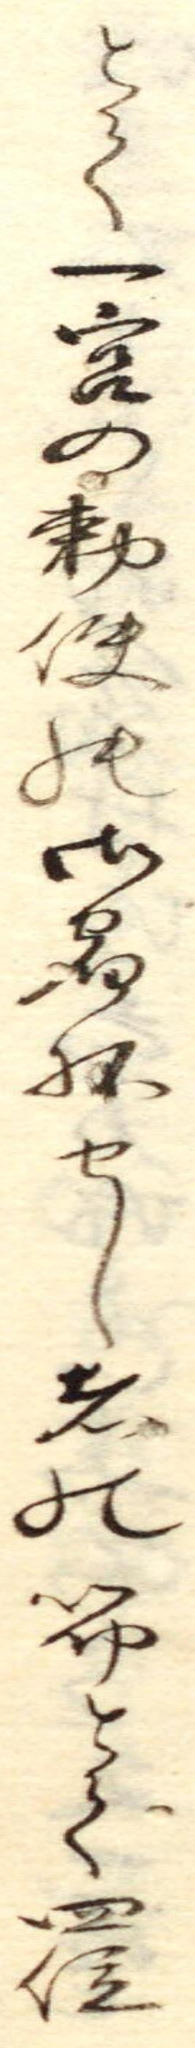とて一宮の勅使の御宿抔せし者の筋とて四位
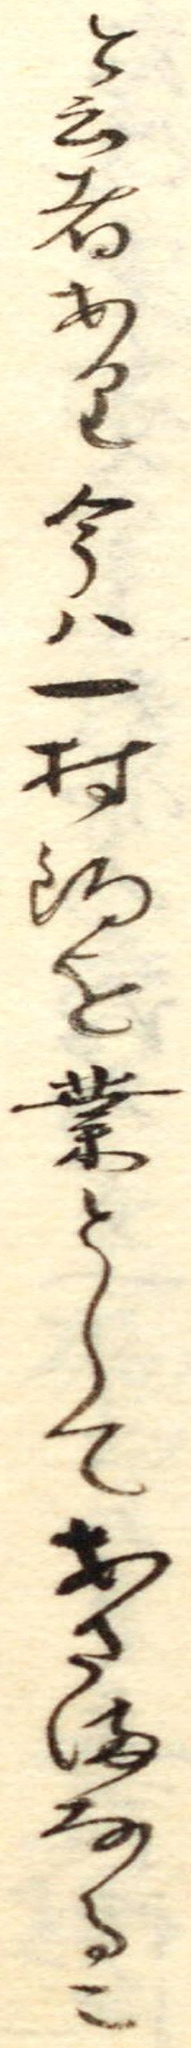と云者あり今は一村釣を業としてあさまなるこ
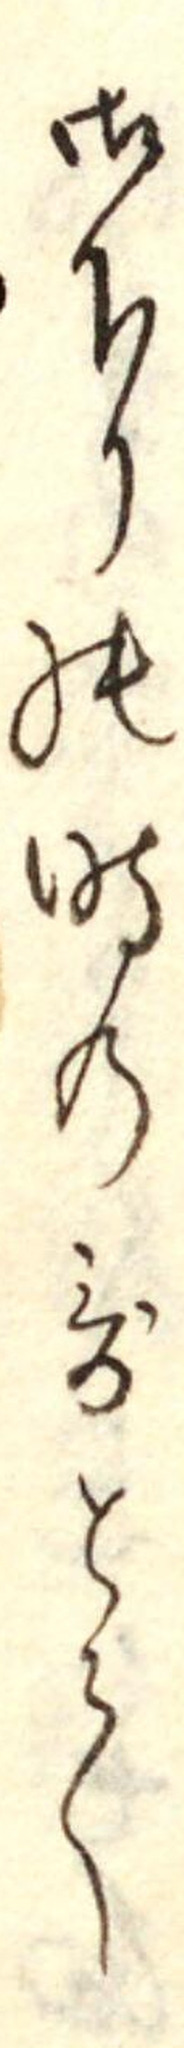御下りの時の哥とて
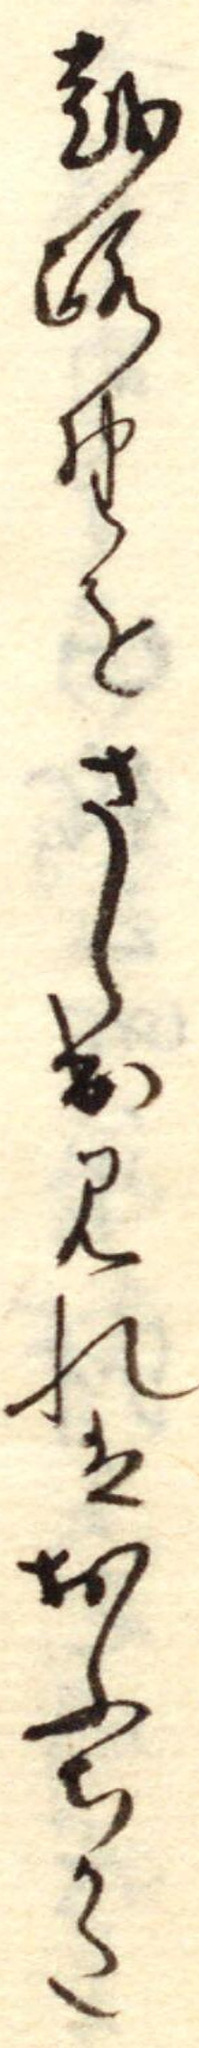越路野をさし出見れはおふちかた
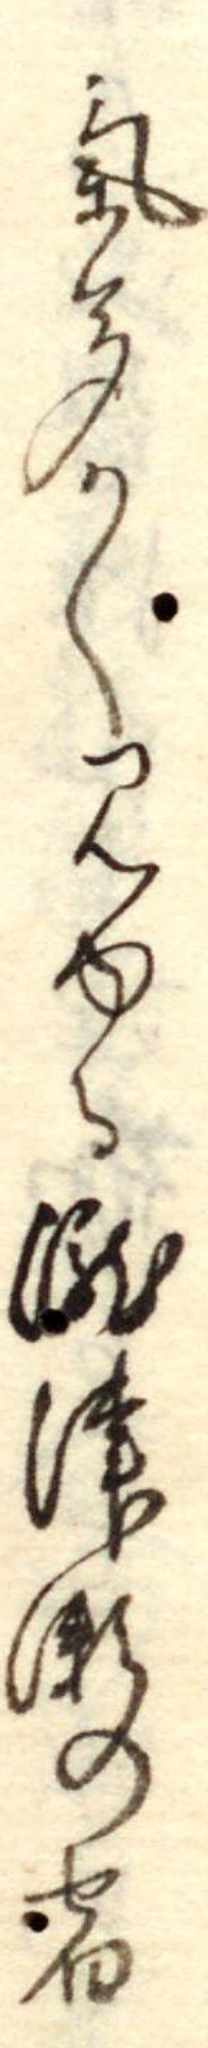気多かく見ゆる瀧津瀬の宿
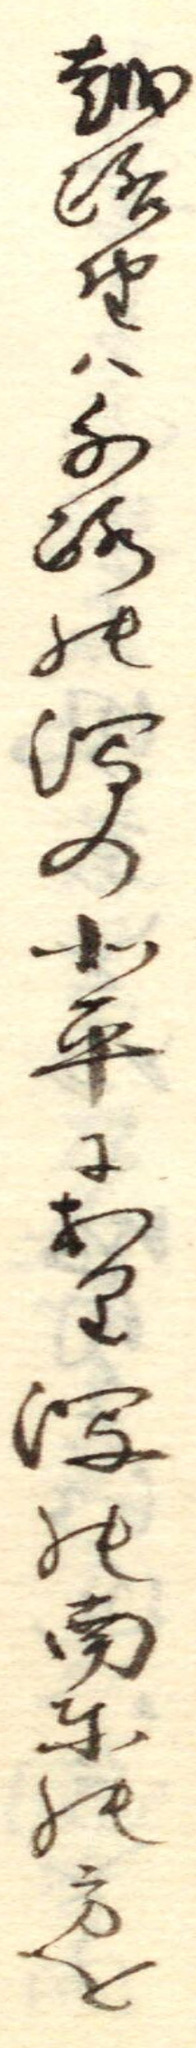越路野は千路の潟の北平にあり潟の南東方を
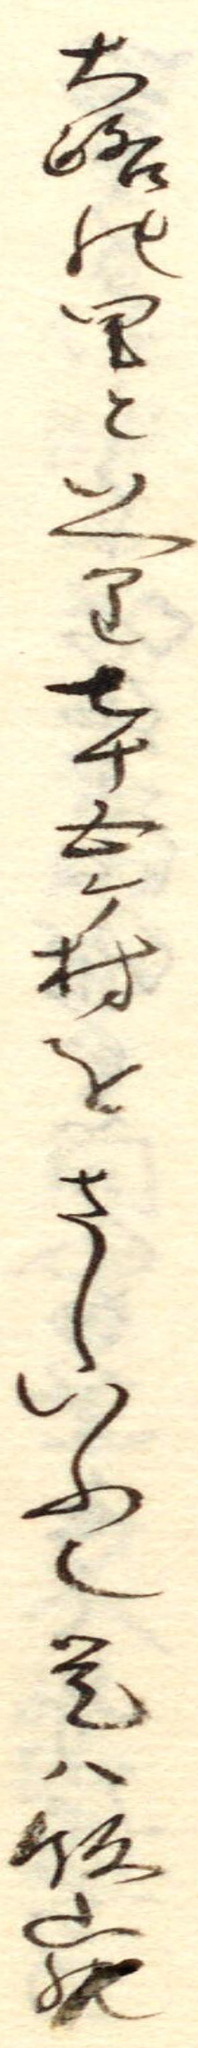大路の里といへり七十五ヶ村をさしいふ也是は飯山の
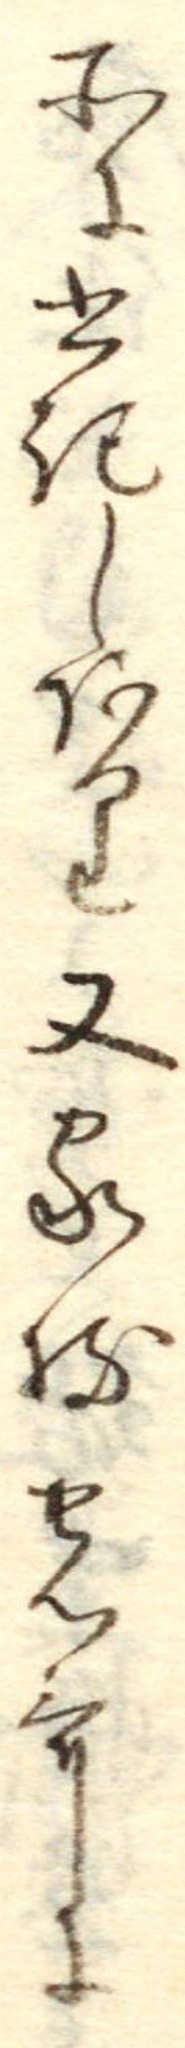所に書記しあり又家持の哥に
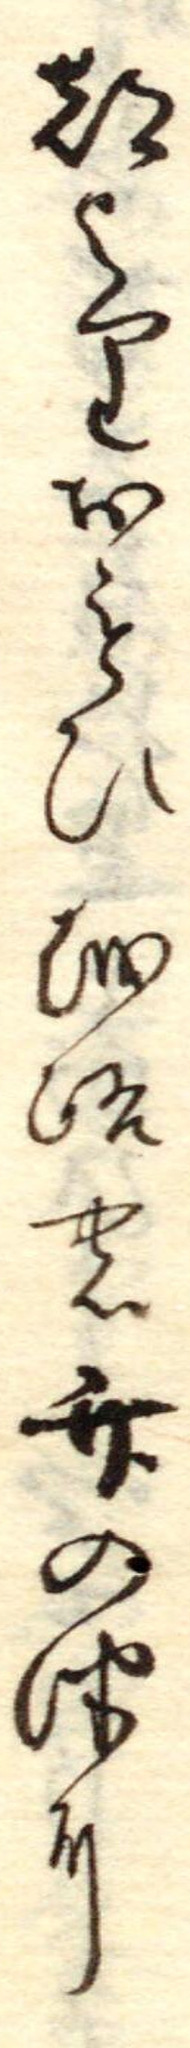都よりおもひ越路の弁の津に
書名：能登名跡誌
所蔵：Ishikawa Prefectural Library
